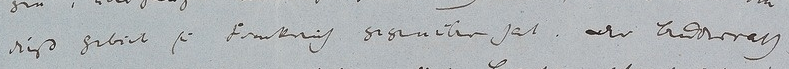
dieß Gebiet sie Frankreich gegenüber hat. Der Bundesrath
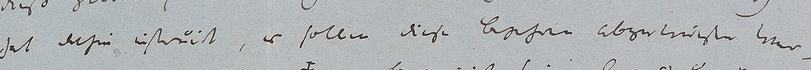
hat dahin instruirt, es sollen diese Begehren abgewiesen wer-
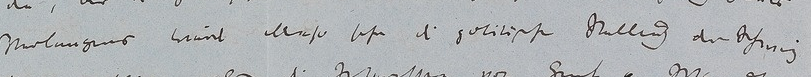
Verlangens würde ebenso sehr die politische Stellung der Schweiz
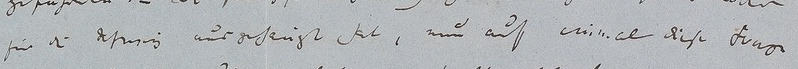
für die Schweiz ausgehängt hat, nun auf einmal diese Frage
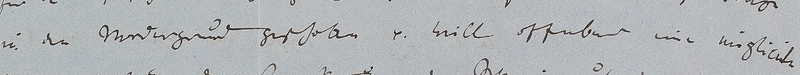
in den Vordergrund geschoben &. will offenbar eine implicite
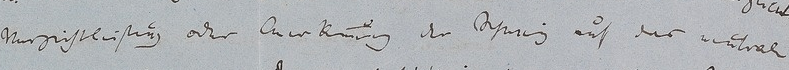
Verzichtleistung oder Anerkennung der Schweiz auf das neutrale
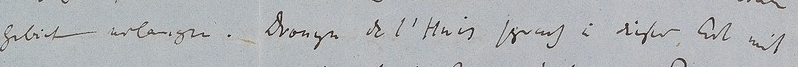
Gebiet verlangen. Drogue de l'Huis sprach in dieser Art mit
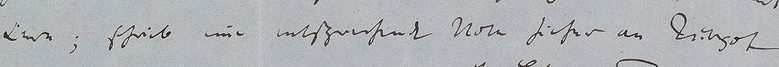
Kern; schrieb eine entsprechende Note hieher an Turgot
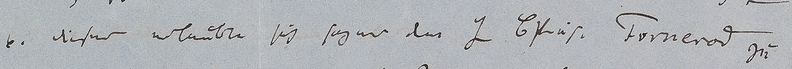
&. dieser erlaubte sich sogar dem Herrn BPräs. Fornerod zu
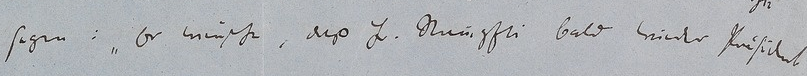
sagen: «Er wünsche, daß Hr. Stämpfli bald wieder Päsident
